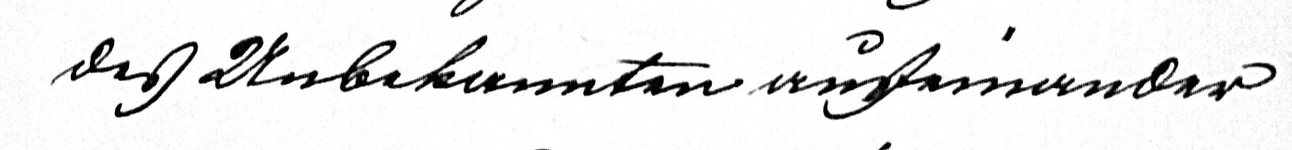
des Unbekannten austeinander
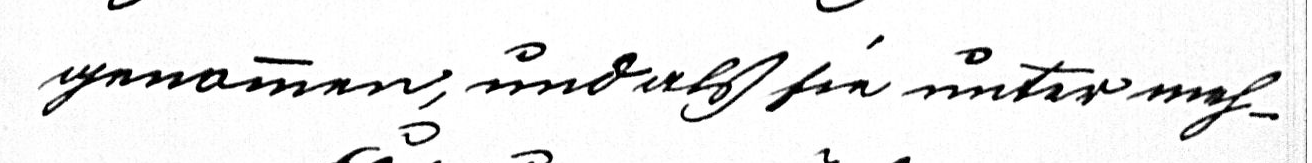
genommen, und als sie unter meh¬
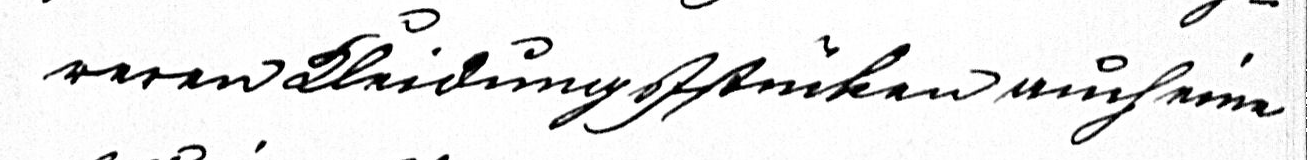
reren Kleidungsstücken auch eine
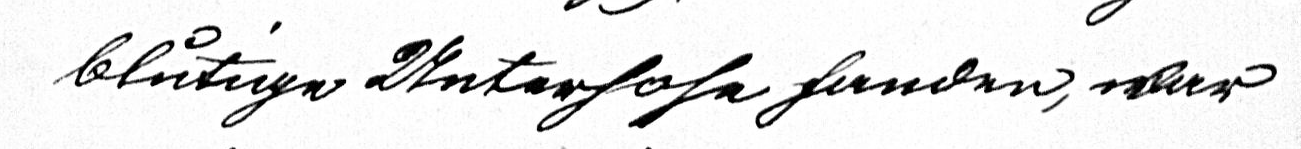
blutige Unterhose fanden, war
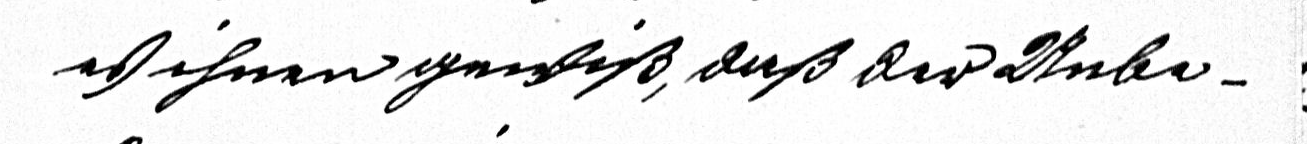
es ihnen gewiß, daß der Unbe¬
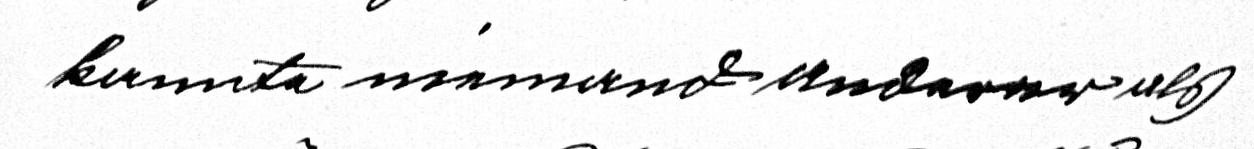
kannte niemand anderer als
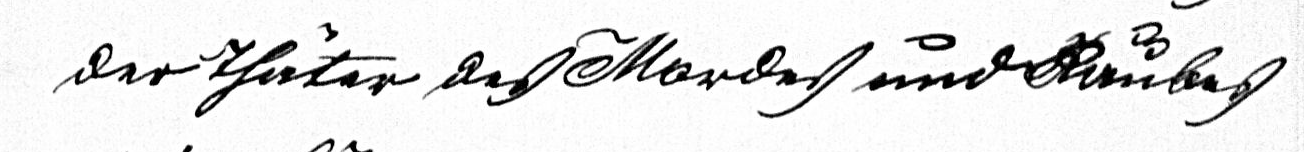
der Thäter des Mordes und Raubes
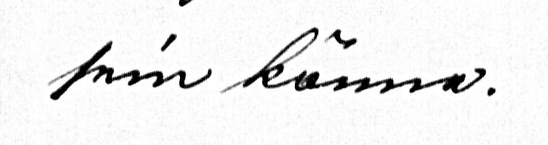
sein könne.
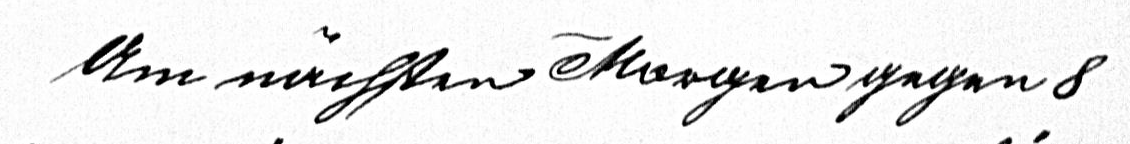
Am nächsten Morgen gegen 8
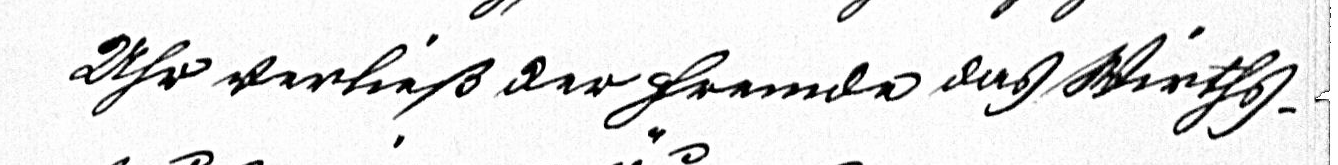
Uhr verließ der Fremde das Wirths¬
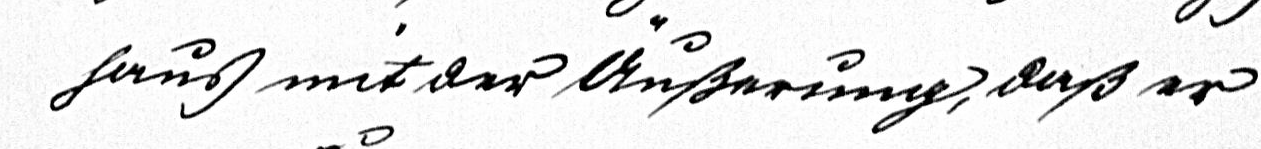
haus mit der Äußerung, daß er
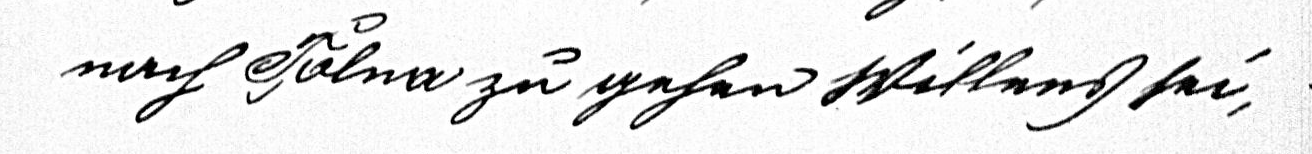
nach Tolna zu gehen Willens sei,
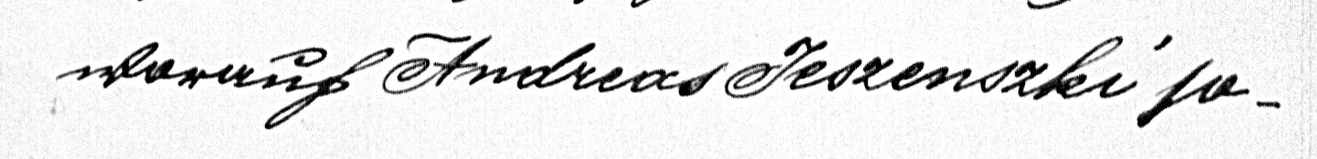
worauf Andreas Jeszenszki so¬
